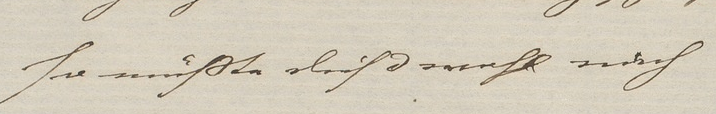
so müßte dieß wohl nach
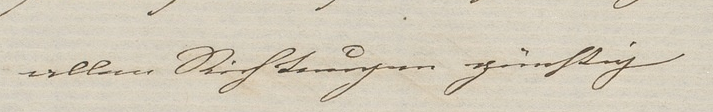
allen Richtungen günstig
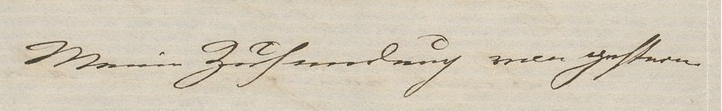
Meine Zusendung von gestern
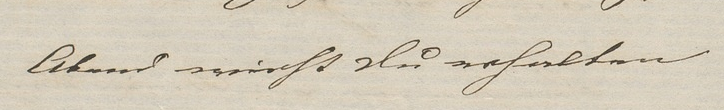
Abend wirst Du erhalten
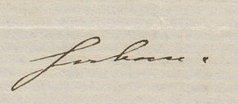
haben.
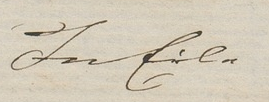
In Eile
